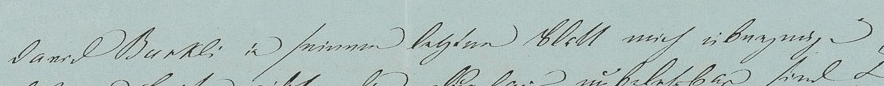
David Burkli in seinem letzten Blatt mich überzeuge,
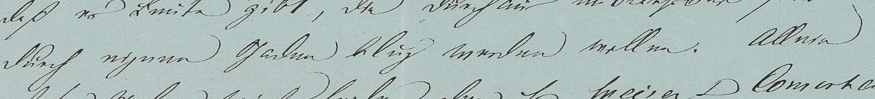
durch eignen Schaden klug werden wollen. Allein
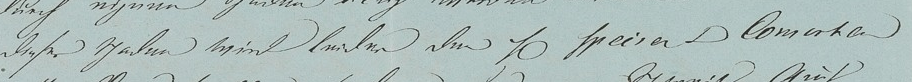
dieser Schaden wird leider den Herrn Speiser & Consorten
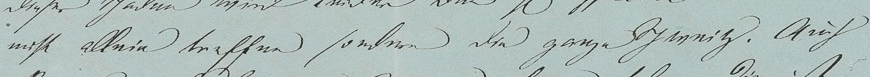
nicht allein treffen sondern die ganze Schweiz. Auch
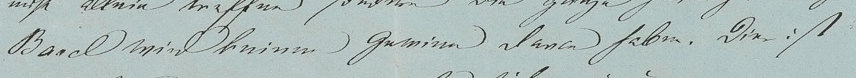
Basel wird keinen Gewinn davon haben. Dies ist
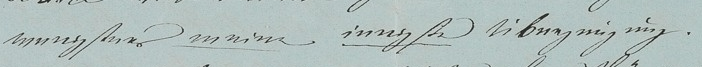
wenigstens meineinnigste Überzeugung.
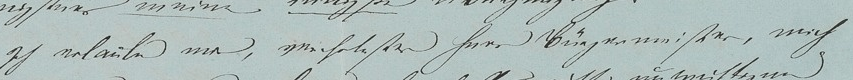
Ich erlaube mir, verehrtester Herr Bürgermeister, mich
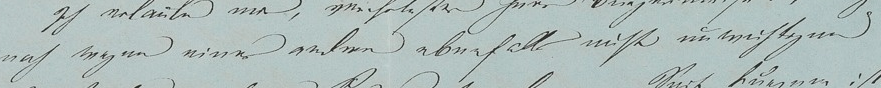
noch wegen eines andern ebenfalls nicht unwichtigen
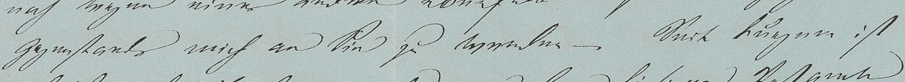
Gegenstands mich an Sie zu wenden –– Seit Kurzem ist
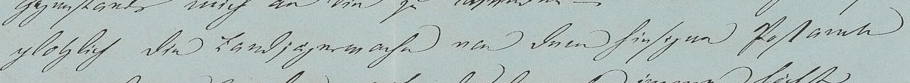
plötzlich die Landjägerwache von dem hiesigen Postamte
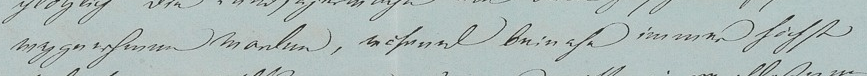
weggenohmen worden, während beinahe immer höchst
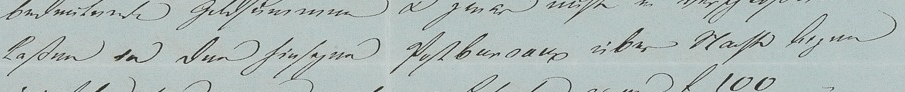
Kaßen von den hiesigen Postbureaux über Nacht liegen
